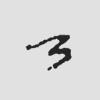乃
